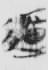𬨭（將）
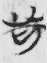苛
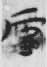晨
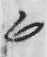㠯（以）
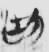○（廷）
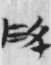阩
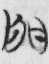門
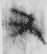又
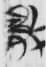敗
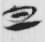旦
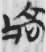塙
